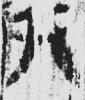四
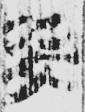○（鄰）
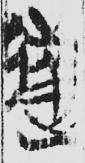○（失）
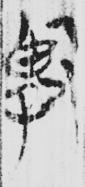○（賢）
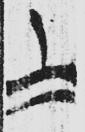士
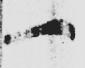一
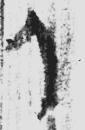人
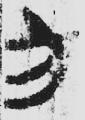方（謗）
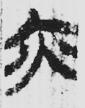亦
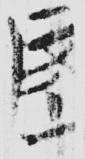○（隨）
